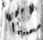巳
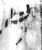凡
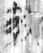○（破）
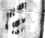日
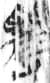矍
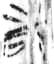之日
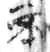不
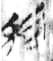利（利）
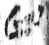㠯（以）
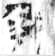祭
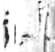祀
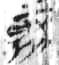聚
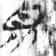眾
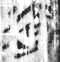迲（去）
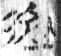○（徙）
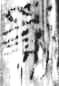○（家）
